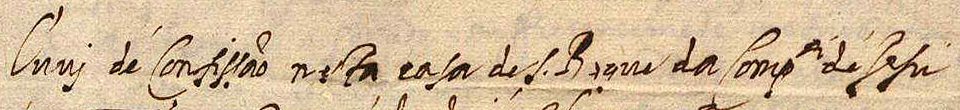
Ouuj de Confissaõ nesta casa de S. Roque da Compa de Jesu
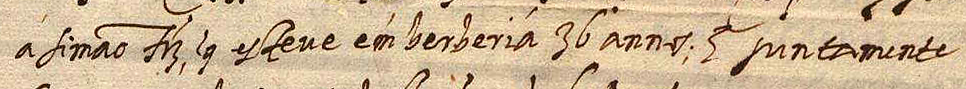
a Simão frz̄, q̄ esteue em berberia 36 annos; E juntamente
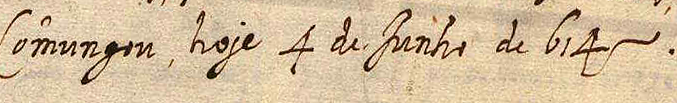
Com̄ungou, hoje 4 de Junho de 614.
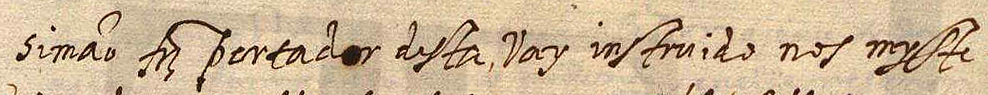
simão frz̄ portador desta vay instruido nos myste
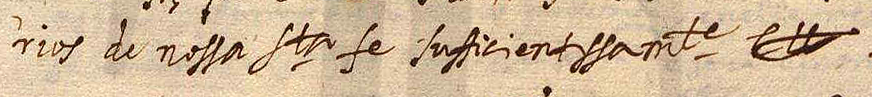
rios de nossa S.ta fe sufficientissamte Ett.
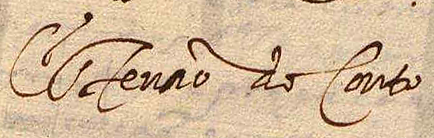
Esteuaõ do Couto
